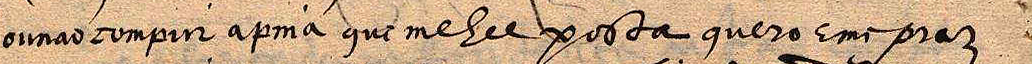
ou não comprir a pnīa que me hee posta quero E me praz
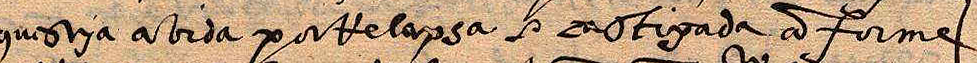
que seya avida por Relapsa e castigada cōforme
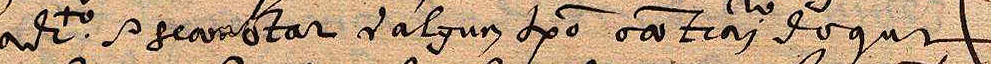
a drto. e se constar ē algum tpō o cōtrajro do que
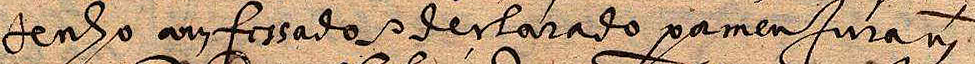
tenho comfessado e declarado por meu Juramto.
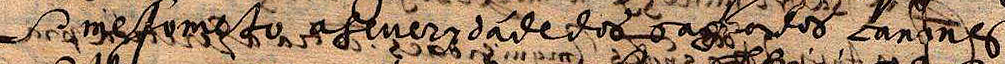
e me someto a seuerydade dos sagrados canones
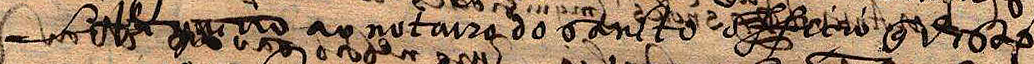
e Requeiro ao notairo do sancto offiçio q̄ disto
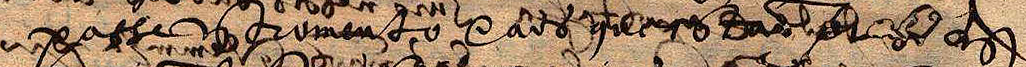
passe estromento e aos que estaõ pr_ētes
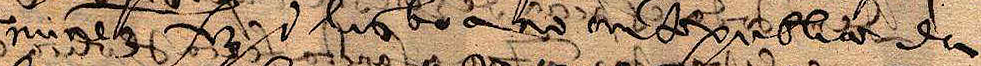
nun̄ez frz ē lisboa no auto publico da
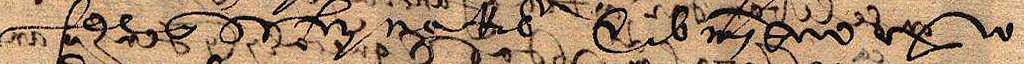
fee q̄ se fez na Ribra ē domj̄guo o pro
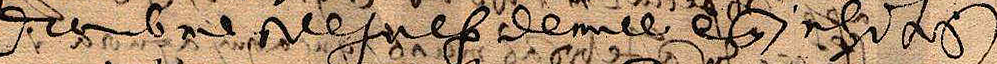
dia do mes de Julho de mill e q̄jnhētos
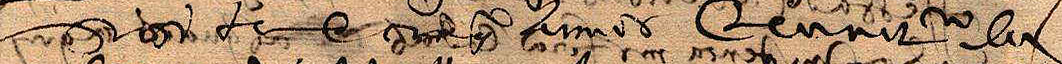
sesēta e cimqo annos E eu notro dou
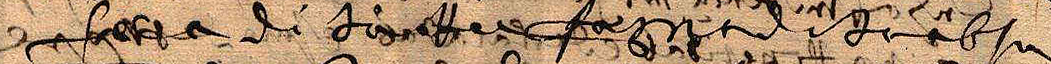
fee a dita Ree fazer a dita abJu
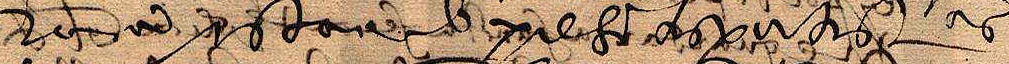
racā estando presētes por testas
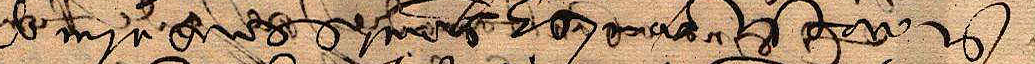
domjnguos sjmões E sjmaõ estaco es
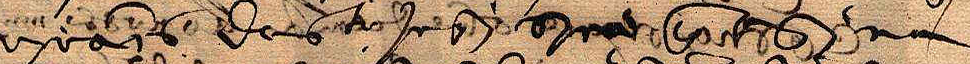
crjvaẽs desta Jnq̄jsjçā q̄ asjna
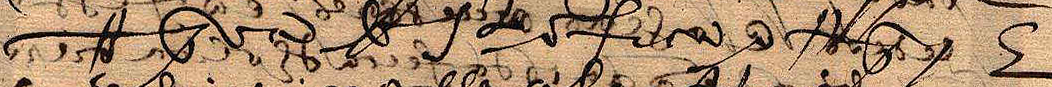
stp̄vā do Sto oficio o stp̄vj E
